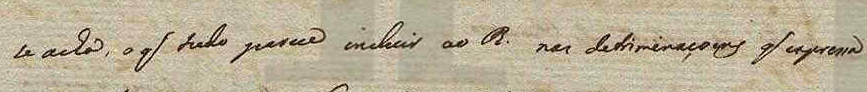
se acha, o q̄ tudo parece incluir ao R. nas detriminaçoens q̄ expressa
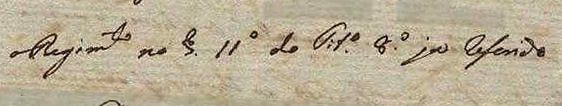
o Regim.to no §. 11.o do Tit.o 8.o ja Referido
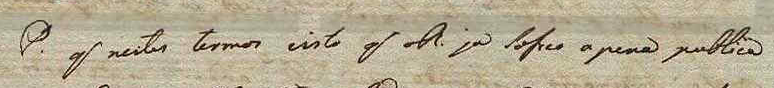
P. q̄ nestes termos visto q̄ o R. ja sofreo a pena publica
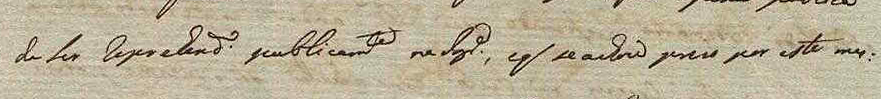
de ser Reprehend.o publicam.te na Igr.a, e q̄ se achou prezo por este mes
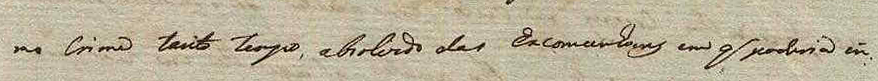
mo crime tanto tempo, absolvido das Excomunhoens em q̄ poderia in
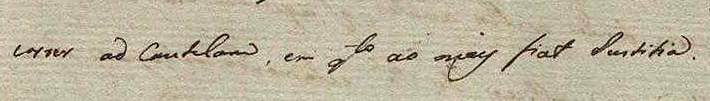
correr ad cautelam, em q.to ao mais fiat Iustitia.
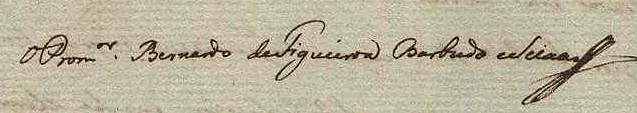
O Prom.or Bernardo de Figueiroa Barbudo e Seixas
